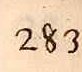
283
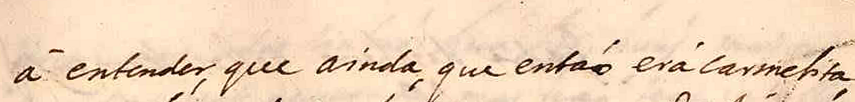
á entender, que ainda, que entaõ era carmelita,
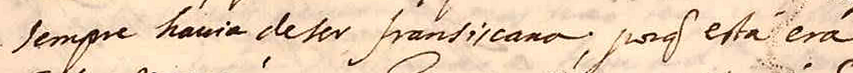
sempre hauia de ser fransiscana; porq̄ esta era
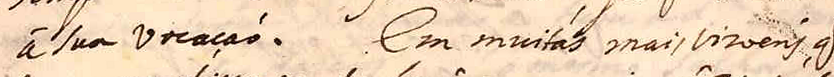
á sua vocaçaõ. Em muitas mais vizoens, q̄
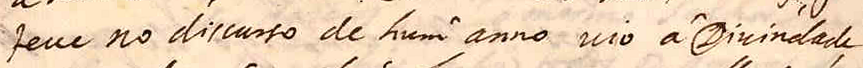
teue no discurso de hum anno uio á Diuindade
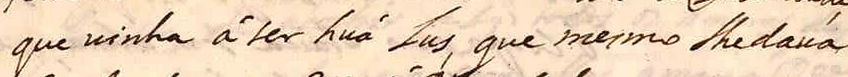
que uinha á ser huā Lus, que mesmo lhe daua
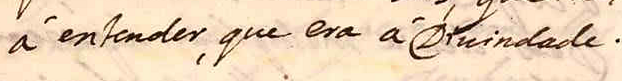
á entender que era á Diuindade.
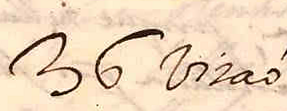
36 Vizaõ
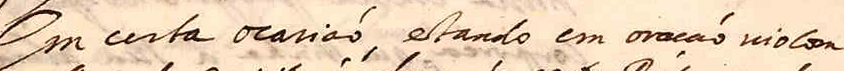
Em certa ocaziaõ, estando em oraçaõ uio com
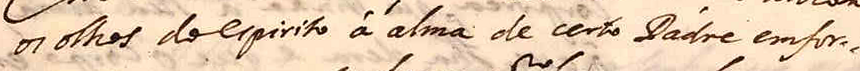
os olhos do espirito á alma de certo Padre em for
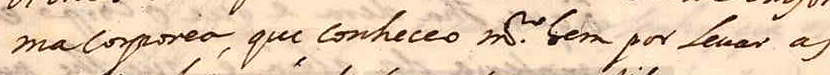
ma corporea, que conheceo m.to bem por leuar as
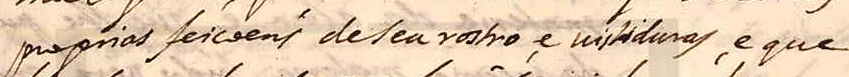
proprias feiçoens de seu rostro, e uistiduras, e que
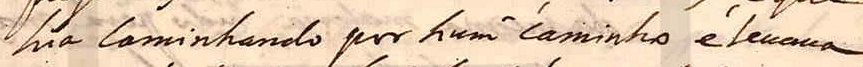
hia Caminhando por hum caminho e leuaua
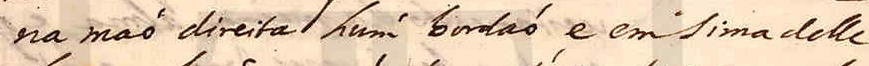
na maõ direita hum bordaõ, e emsima delle
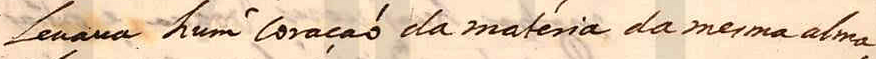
Leuaua hum coraçaõ da materia da mesma alma,
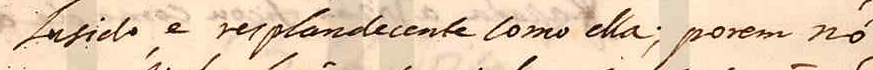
lusido, e resplandecente como ella; porem nó
